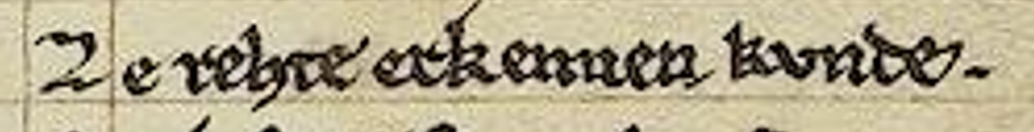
Ze rehte erkennen kvnde.
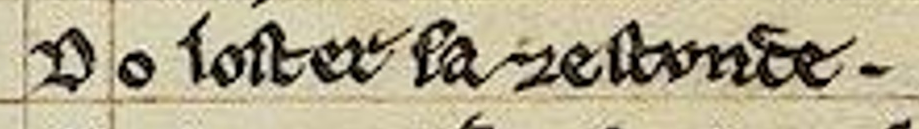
Do loſter ſa zeſtvnde.
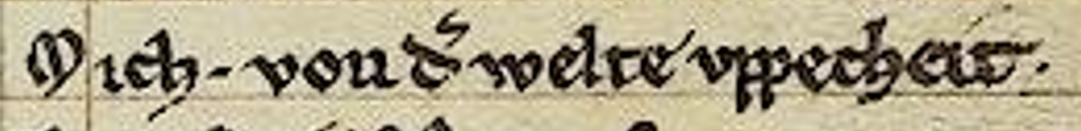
Mich. von d(er) welte vppecheit.
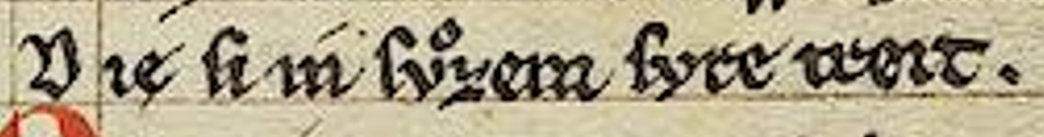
Die ſi in ſv°ozem ſvre treit.
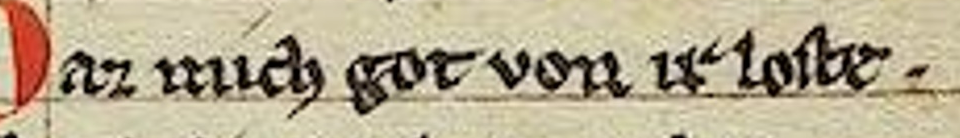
*Daz mich got von ir loſte.
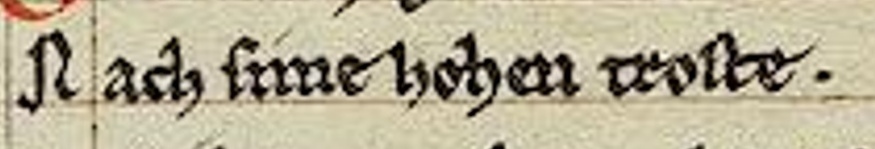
Nach ſime hohen troſte.
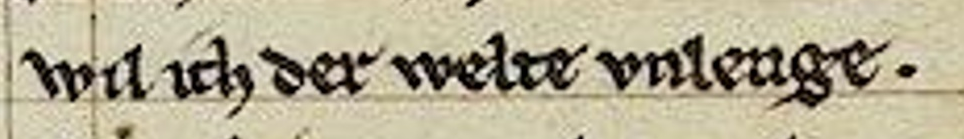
Wil ich der welte vnlenge.
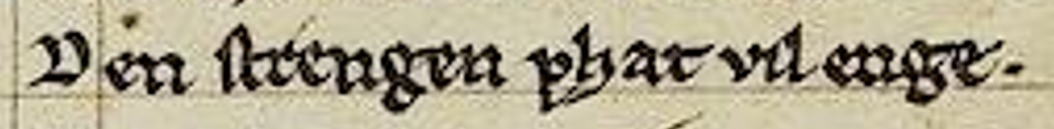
Den ſtrengen phat vil enge.
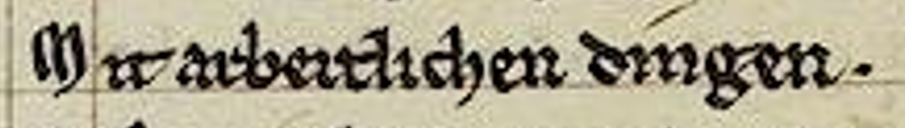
Mit arbeitlichen dingen.
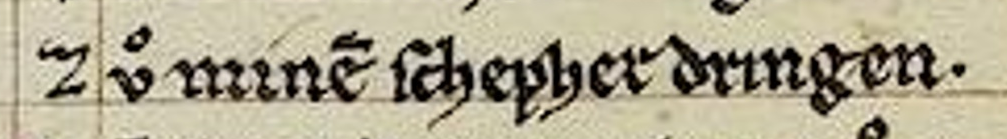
Zv°o mine(m) ſchepher dringen.
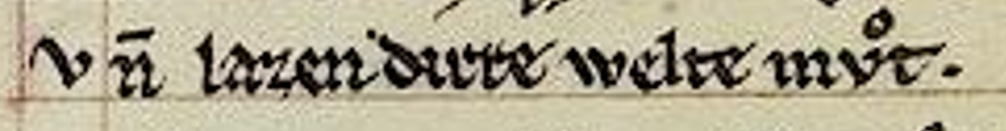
Vn(d) lazen dirre welte mv°ot.
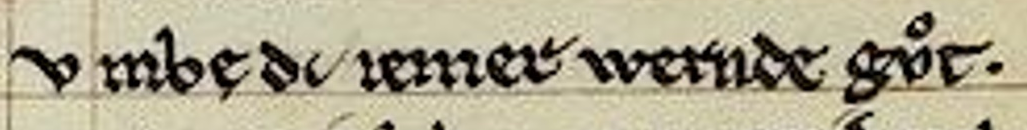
Vmbe d(az) iemer wernde gv°ot.
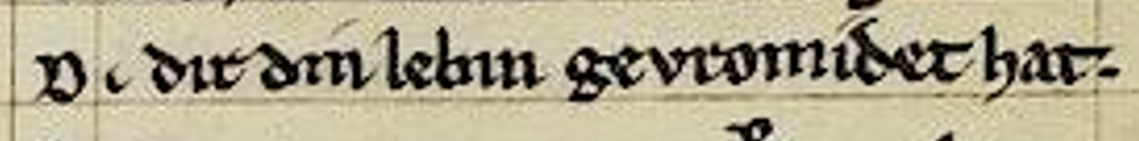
D(az) dir din lebin gevromidet hat.
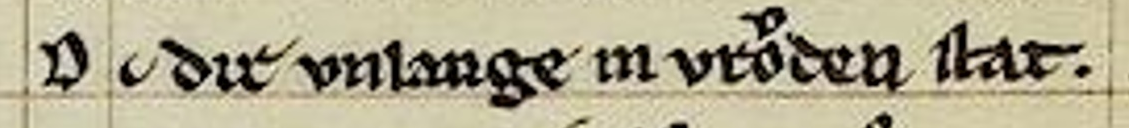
D(az) dir vnlange in vro°vden ſtat.
